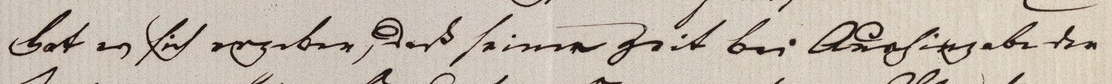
hat es sich ergeben, daß seiner Zeit bei Aushingabe der
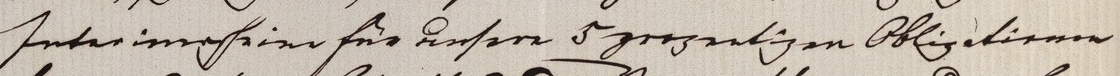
Interimsscheine für unsere 5prozentigen Obligationen
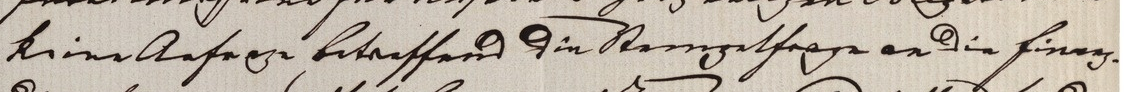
keine Anfrage betreffend die Stempelfrage an die Finanz-
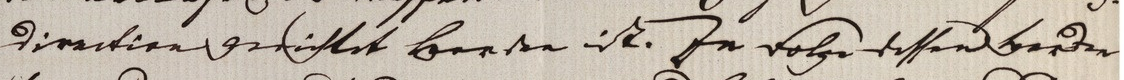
direction gerichtet worden ist. In Folge dessen werden
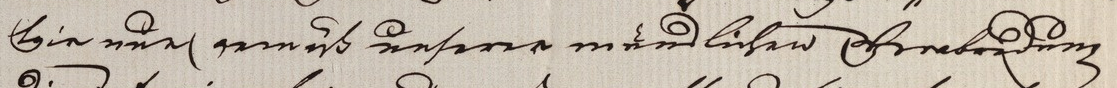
wir nun gemäß unserer mündlichen Verabredung
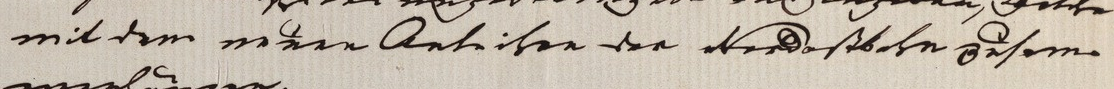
mit den neuen Anleihen der Nordostbahn zusam-
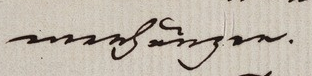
menhängen.
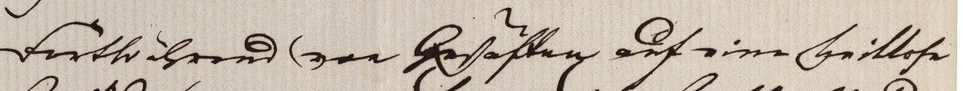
Fortwährend von Geschäften auf eine heillose
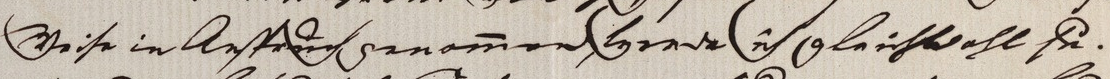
Weise in Anspruch genommen, werde ich gleichwohl su-
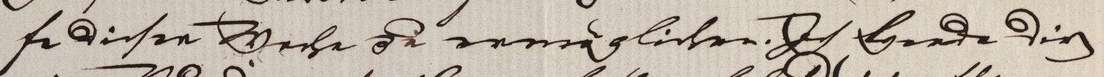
fe dieser Woche zu ermöglichen. Ich werde dir
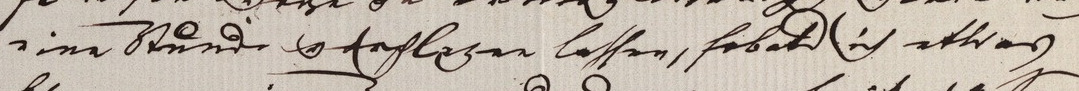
eine Stunde vorschlagen lassen, sobald ich etwas
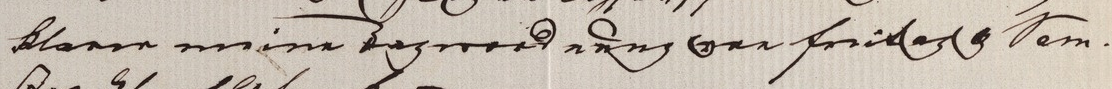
klarer meine Tagesordnung von Freitag & Sam-
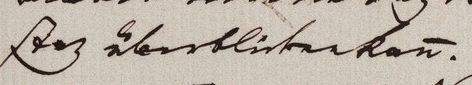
stag überblicken kann.
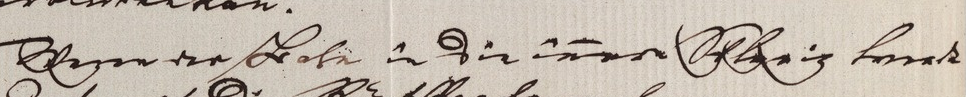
Wegen der Bahn in die innere Schweiz werde
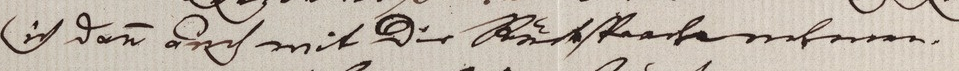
ich dann auch mit Dir Rücksprache nehmen.
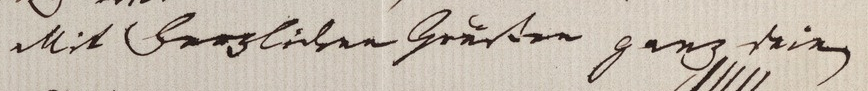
Mit herzlichen Grüßen ganz Dein
